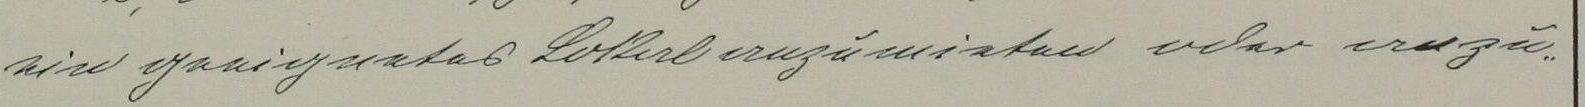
ein geeignetes Lokal anzumieten oder anzu-
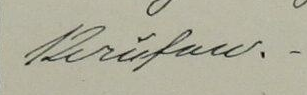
kaufen.
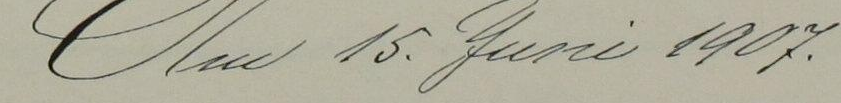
Am 15. Juni 1907.
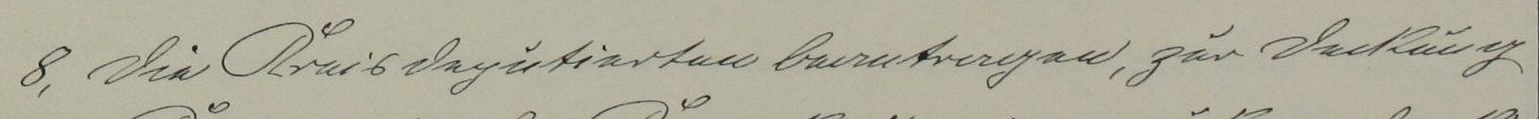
8. Die Kreisdeputierten beantragen, zur Deckung
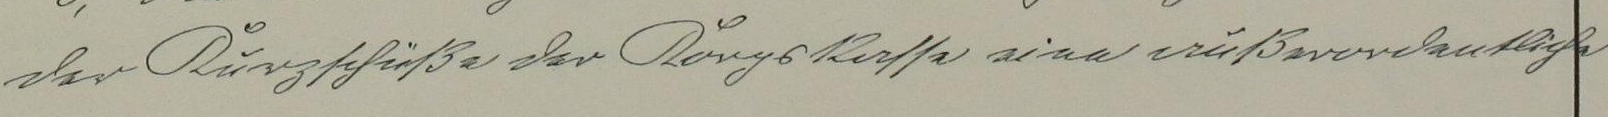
der Kurzschüße der Korpskasse eine außerordentliche
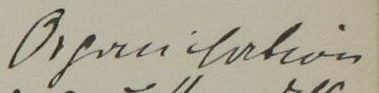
Organisation
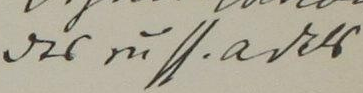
des russ. adels
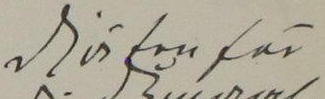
Diäten für
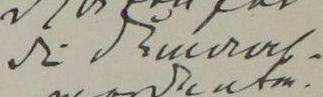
die Dumaab
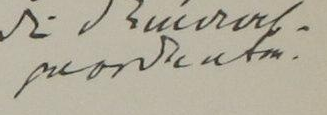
geordneten
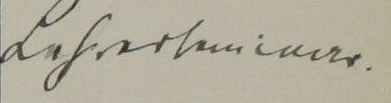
Lehrerseminar
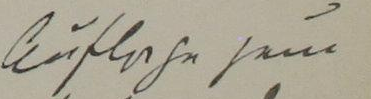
Auflage zum
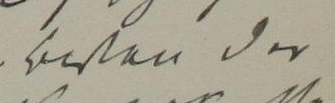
Besten der
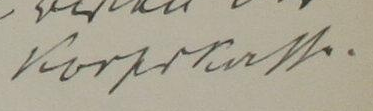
Korpskasse.
